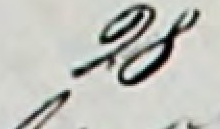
28
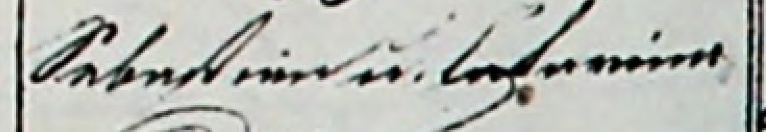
Sebastian u. Catarinne
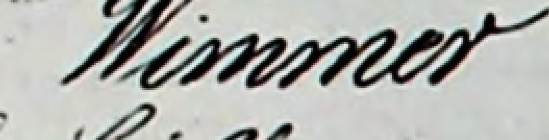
Wimmer
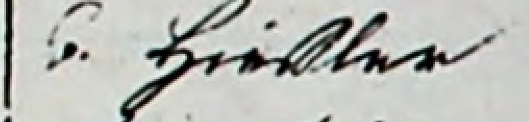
v. Hirsler
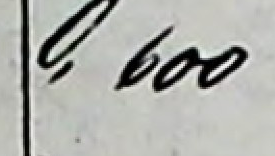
0,600
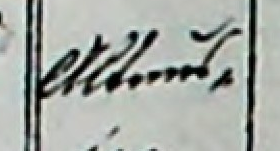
Altaus„
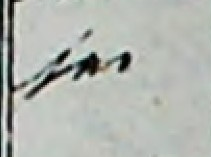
see
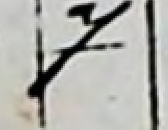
7
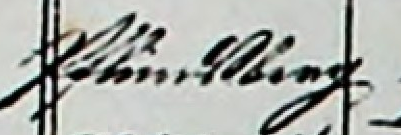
Pflindsberg
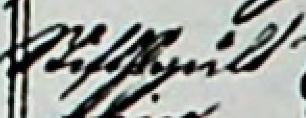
Stiftsgült
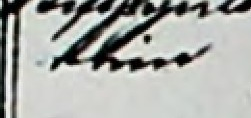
Rein
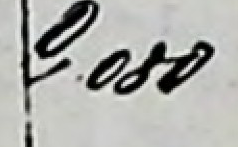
0,080
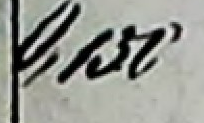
0,150
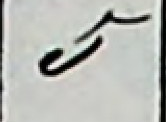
5
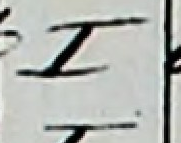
I
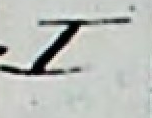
I
